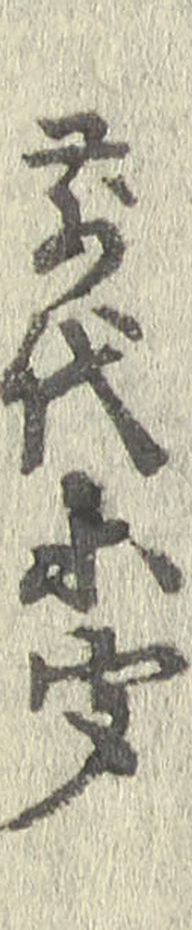前代未聞
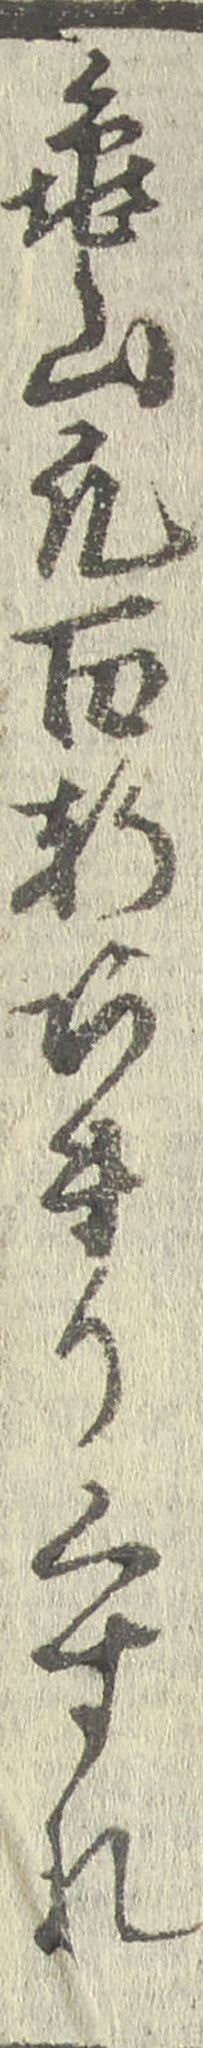亀山凡百軒あまりくすれ
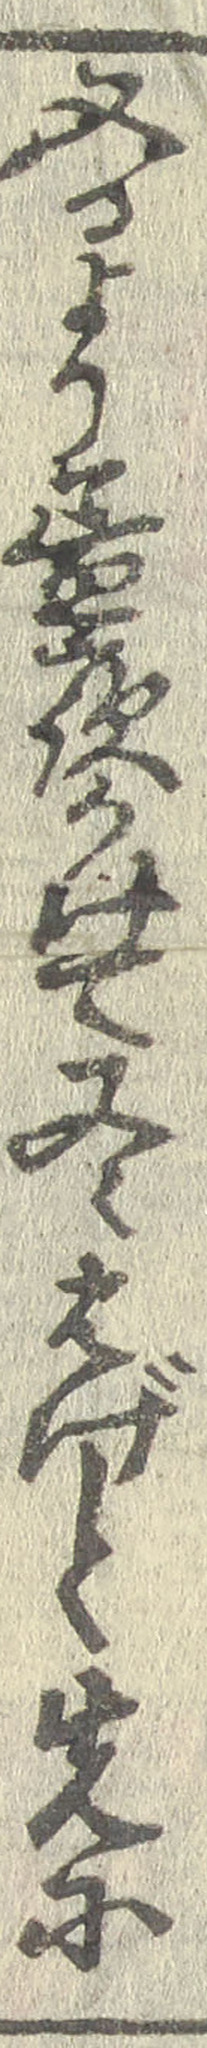五日より昼夜かけて又々はげしく先に
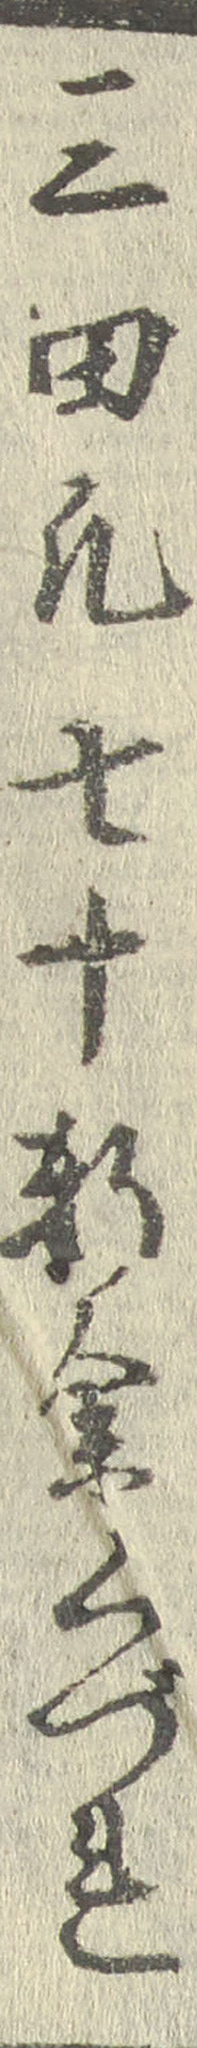三田凡七十軒余くづれ
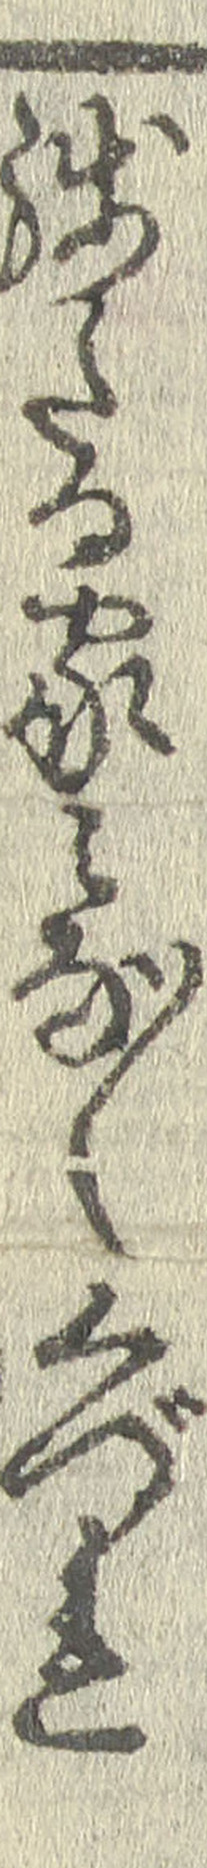残たる家みな〳〵くづれ
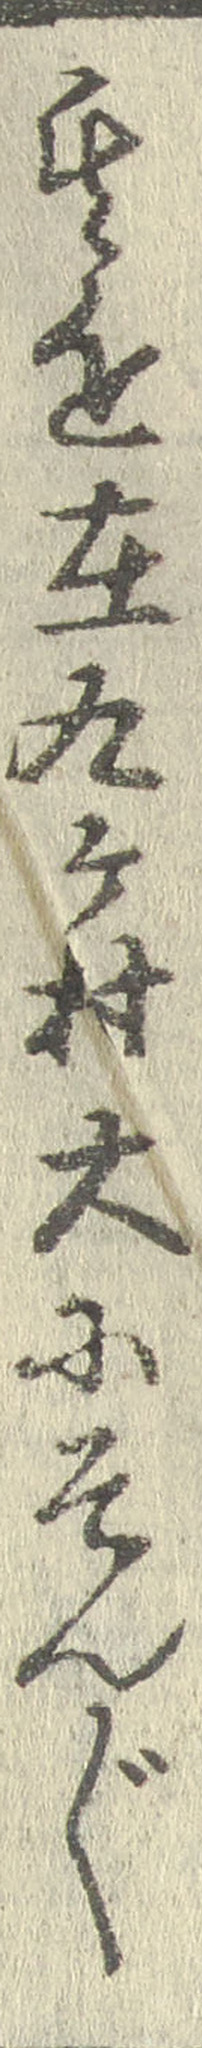其近在九ケ村大にそんじ
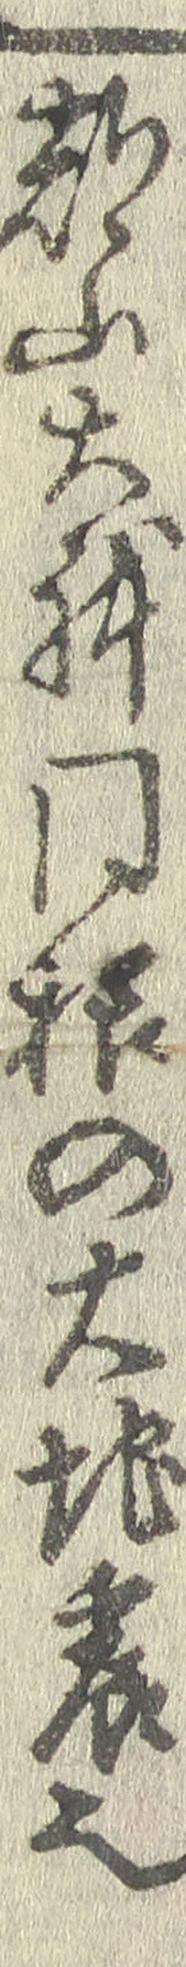郡山大躰同様の大地震也
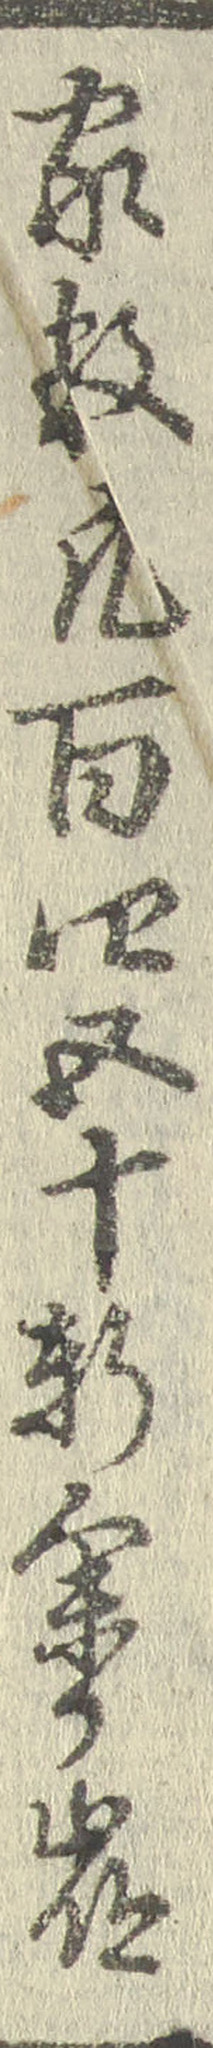家数凡百四五十軒余り崩
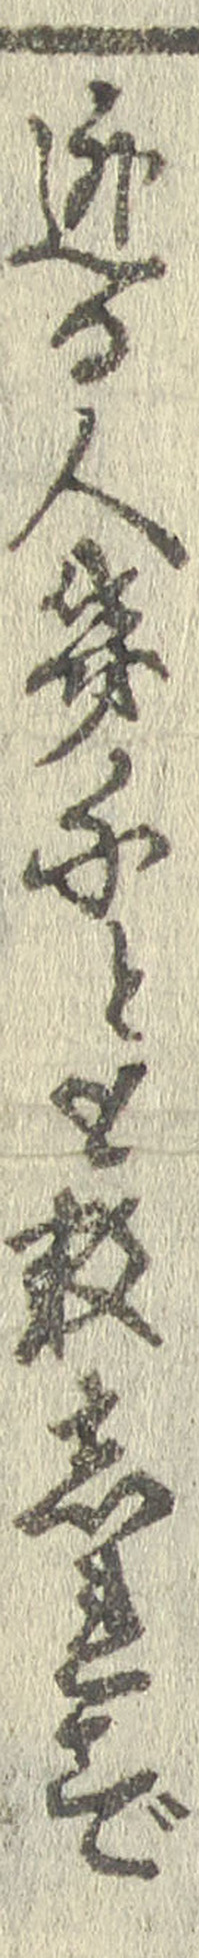逃る人幾千とも数しれず
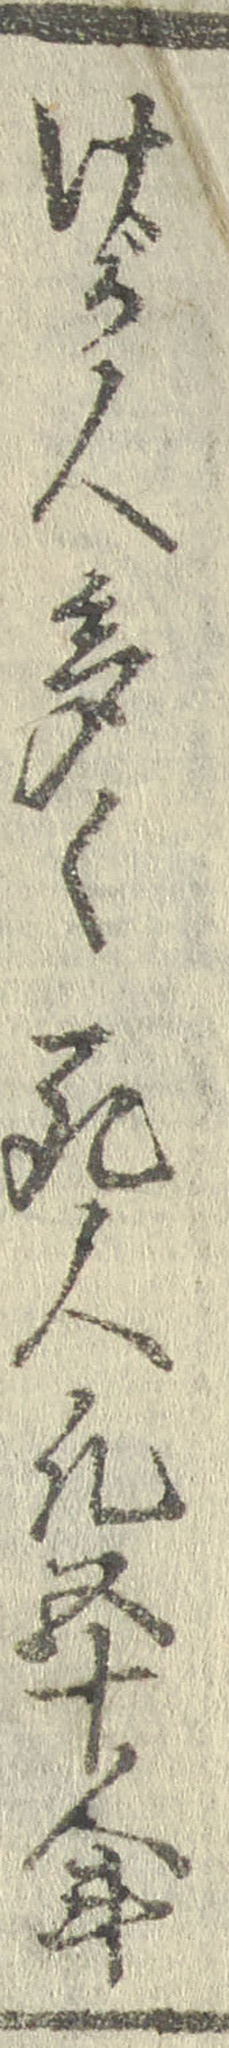けが人多く死人凡五十人斗
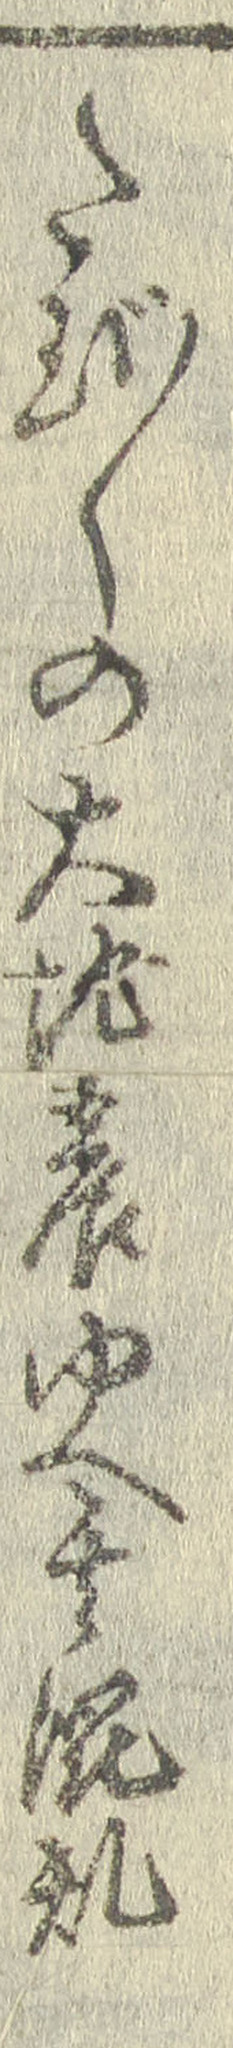たび〳〵の大地震ゆへ其混乱
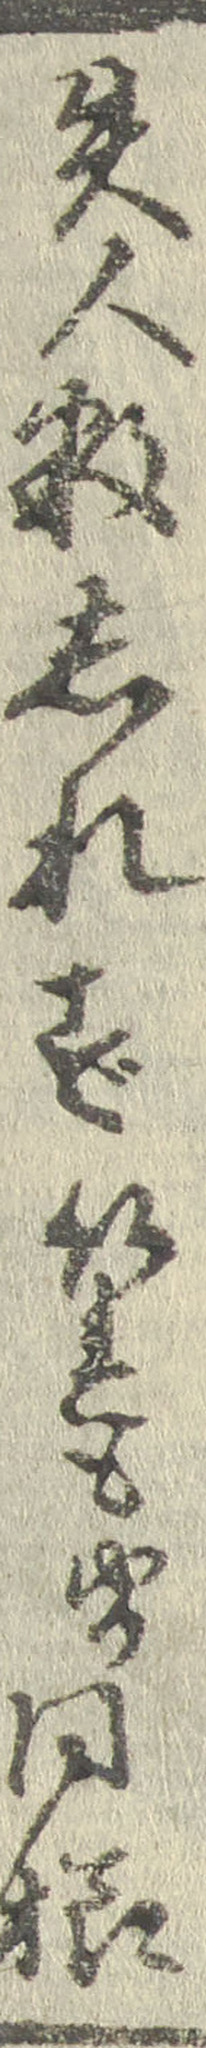失人数しれず何れもゆり同様
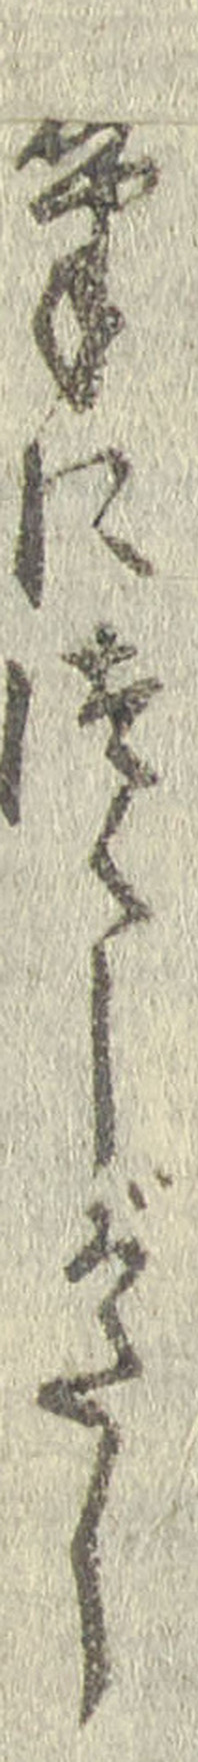筆につくしがたし
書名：聞書諸国并大阪大地震つなみ
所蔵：東京大学総合図書館 General Library in the University of Tokyo, JAPAN
